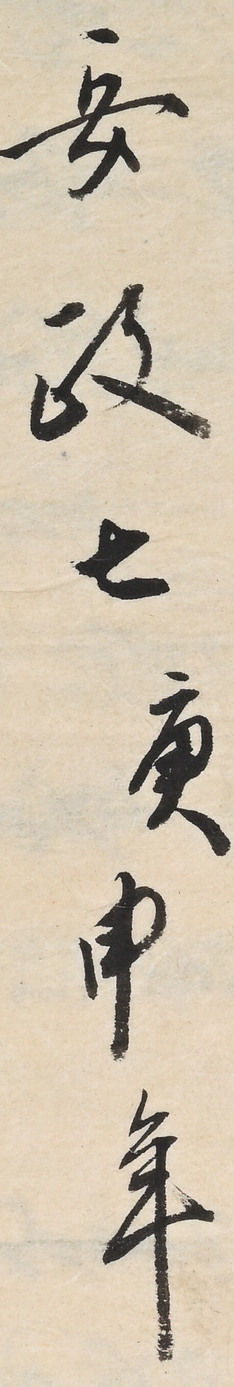安政七庚申年
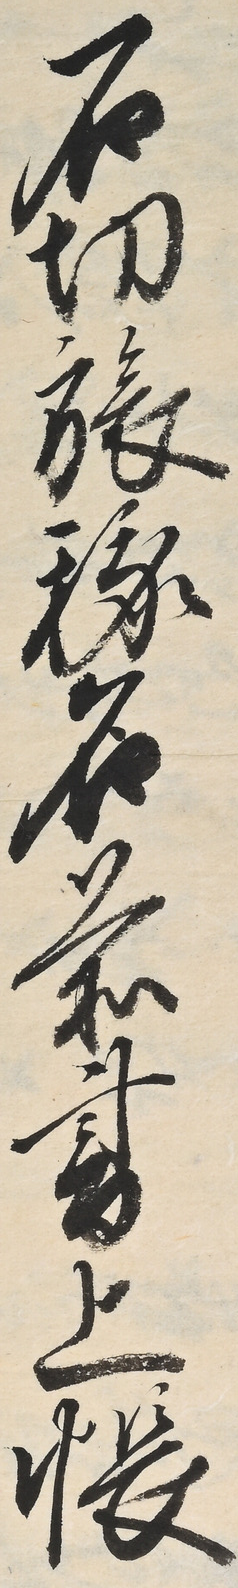石切旅稼名前書上帳
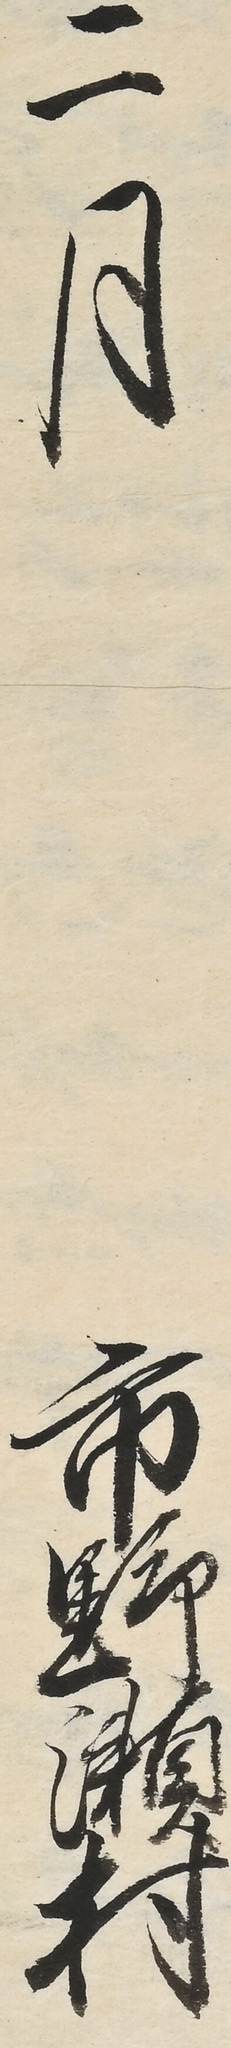二月市野瀬村

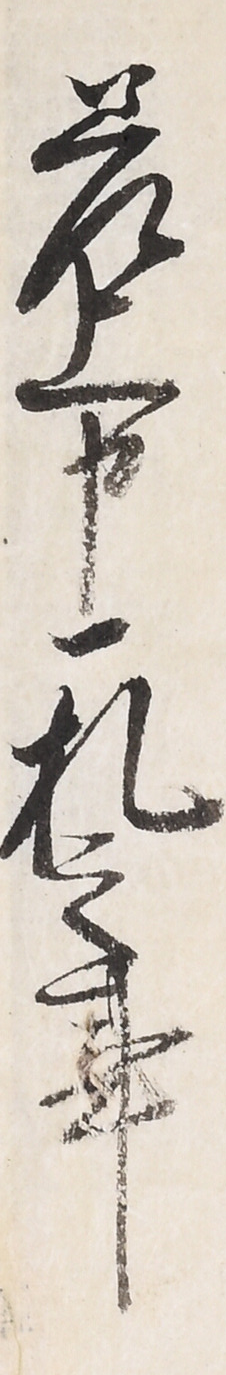差上申一札之事
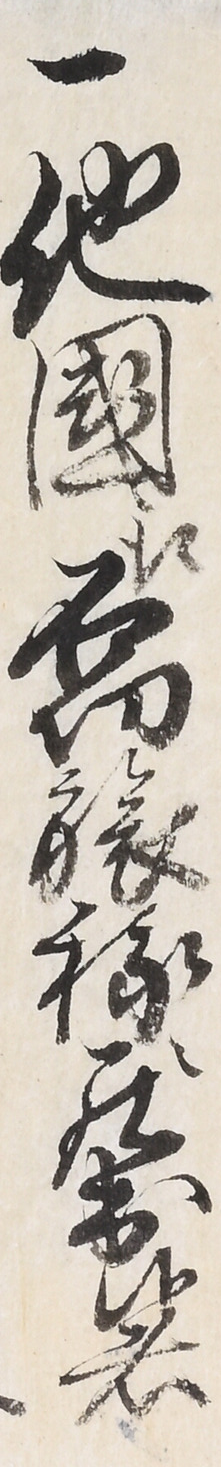一他国江石切旅稼ニ罷出候者
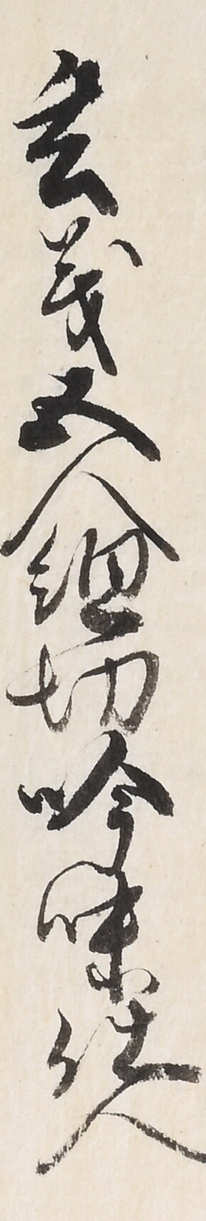共義五人組切吟味仕人
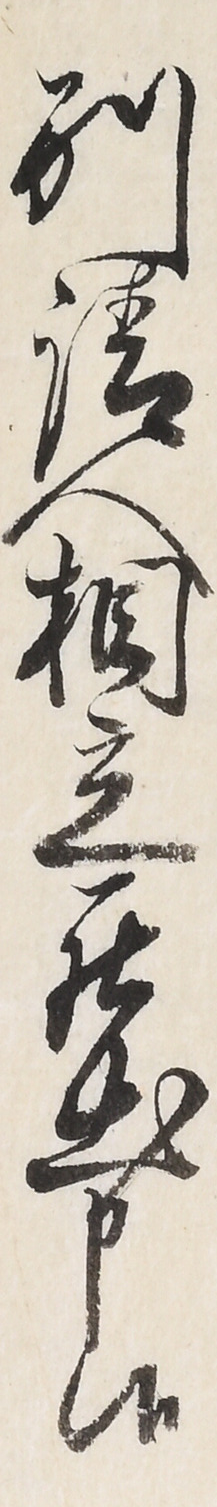別請人相立罷出申候
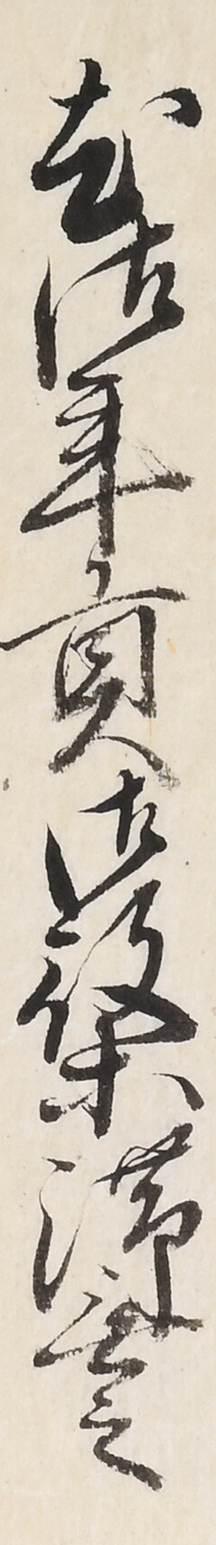尤御年貢御役等滞無之
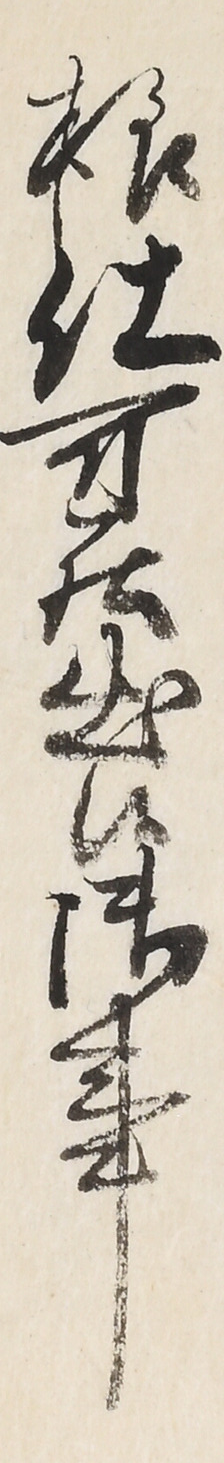様仕可罷出候御事
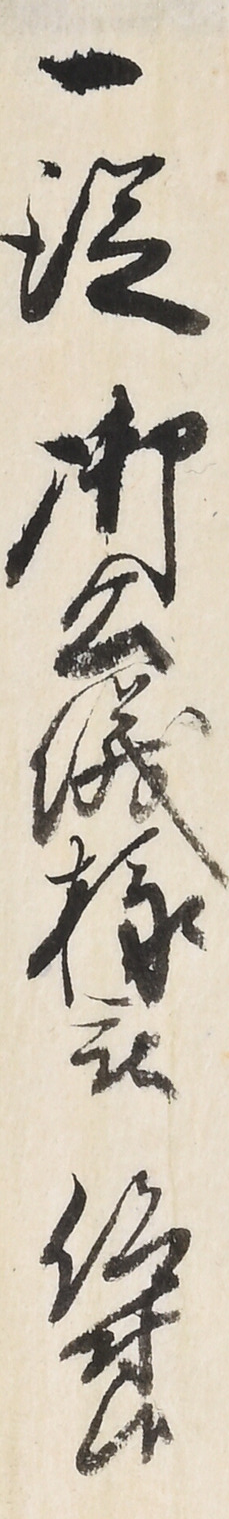一従御公儀様被仰付候
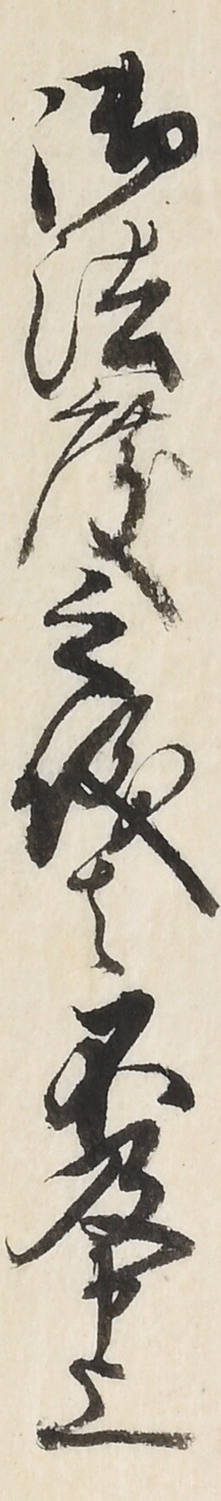御法度之儀者不及申上
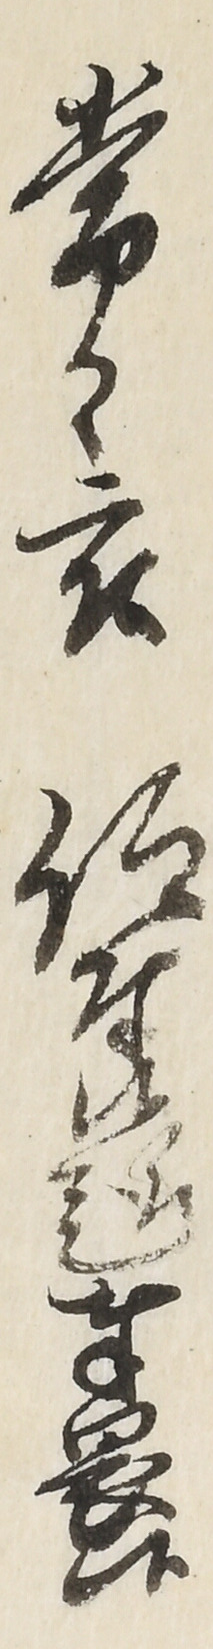常々被仰付候趣奉畏候
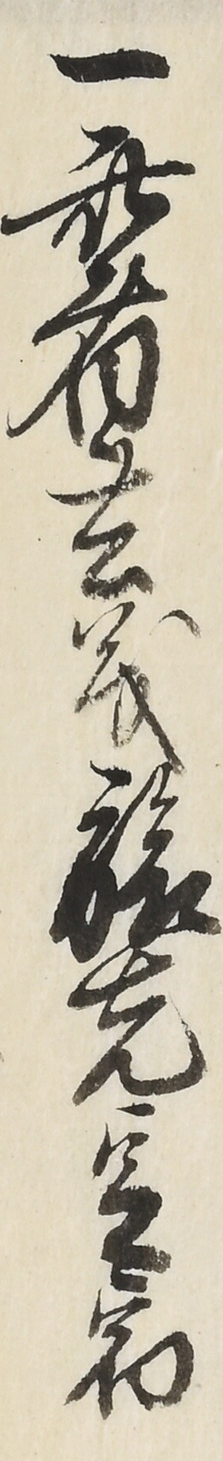一此者共義旅先定宿
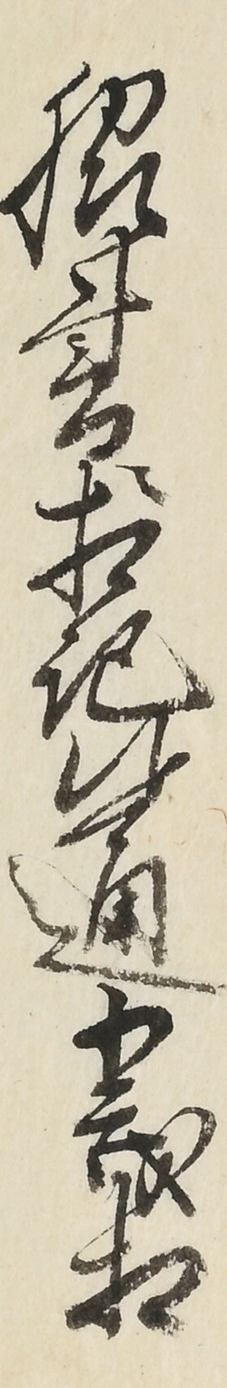脇書ニ相記候通少茂相
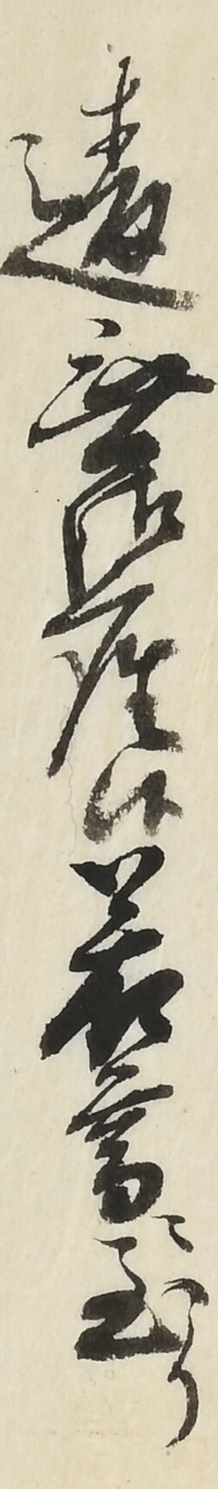違無御座候若暮ニ至リ
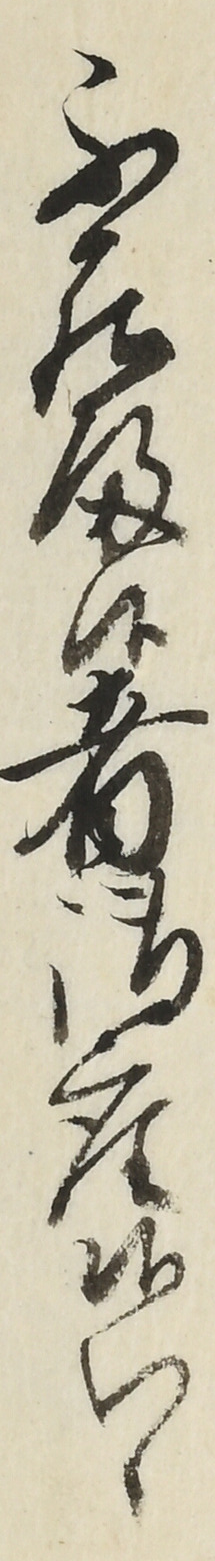不罷帰候者御座候ハヽ
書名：安政七庚申年二月石切旅稼名前書上帳
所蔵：伊那市立高遠町図書館・合同会社AMANE
